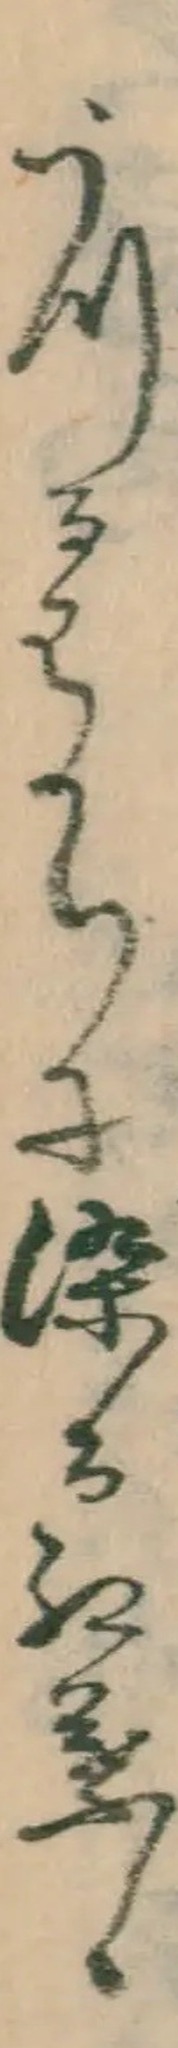うつるはかりに染る紅葉々

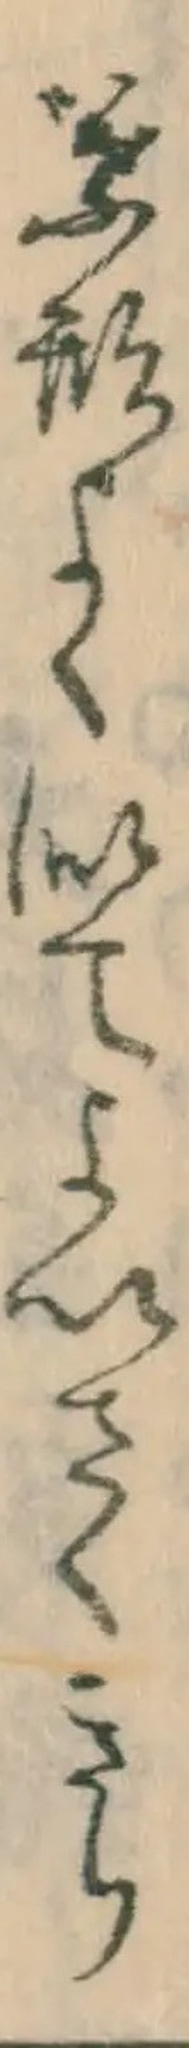葉形よく似てよいさくきり
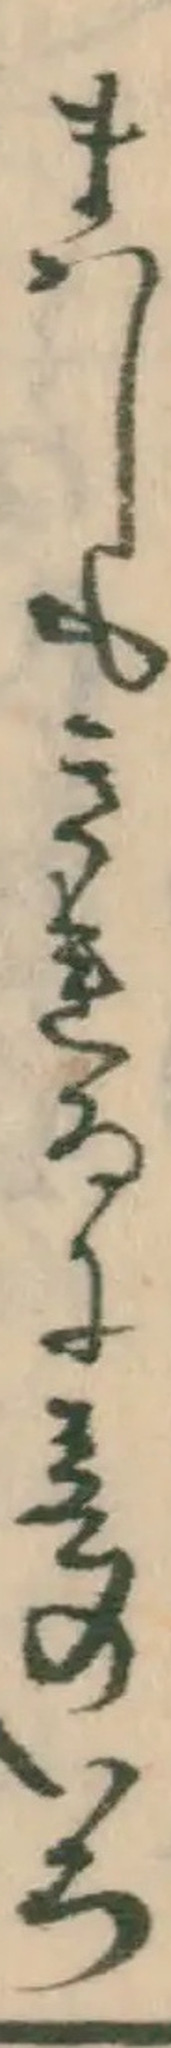まはしもきれゐに春のいろ
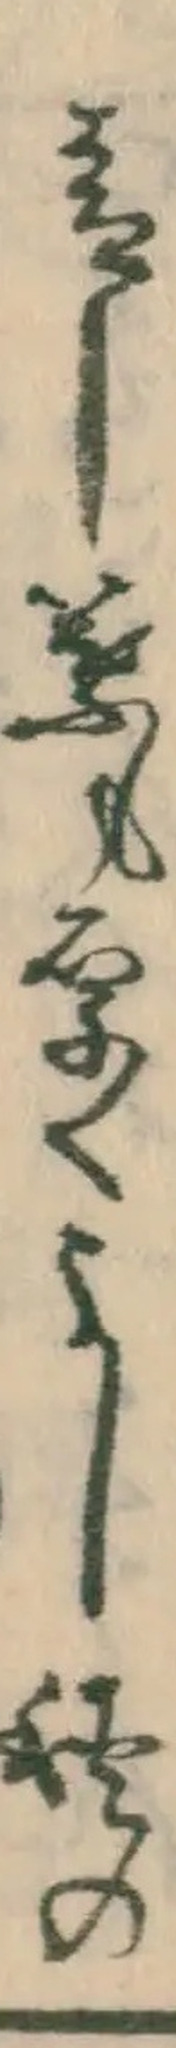青し葉も厚くよし秋の
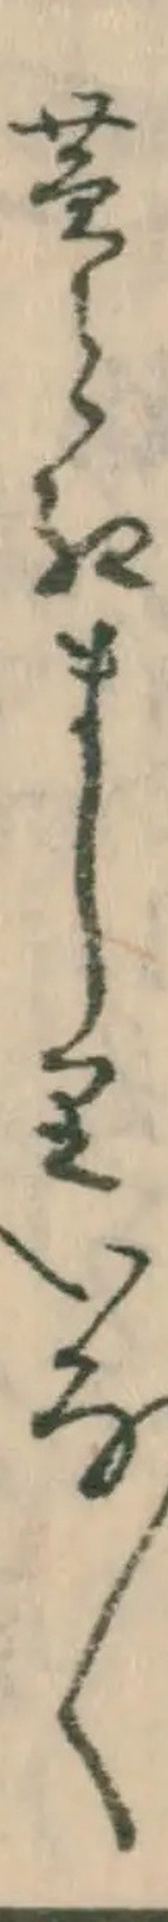黄と紅ましりいろ〳〵
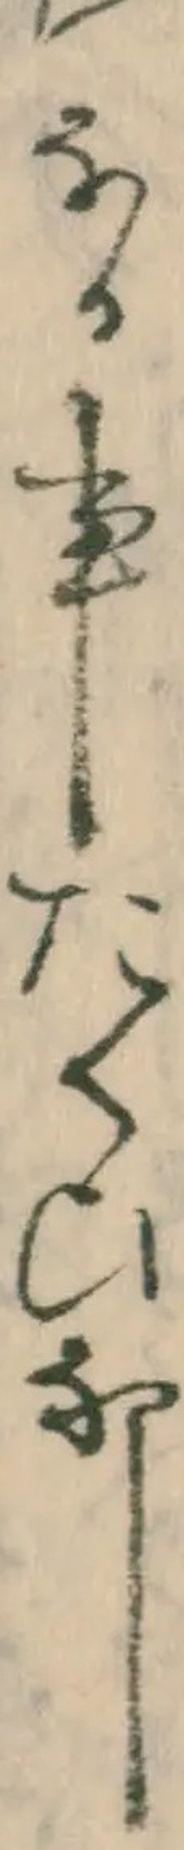なる事たくいなし
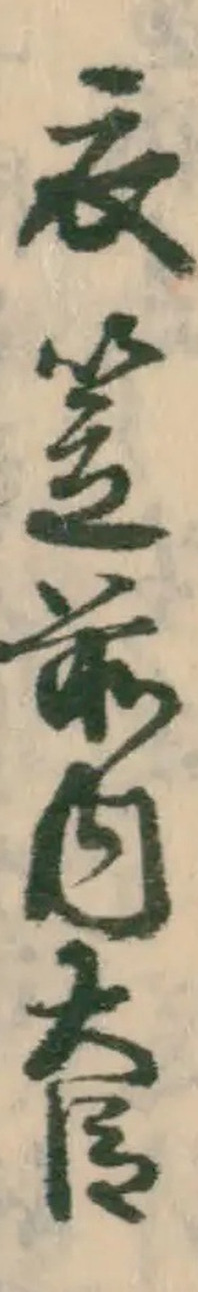衣笠前内大臣
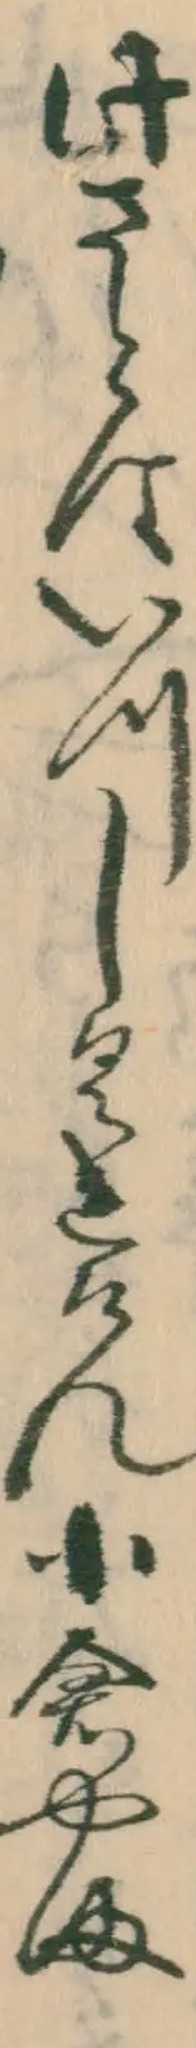此さとはいつしくれけん小倉やま
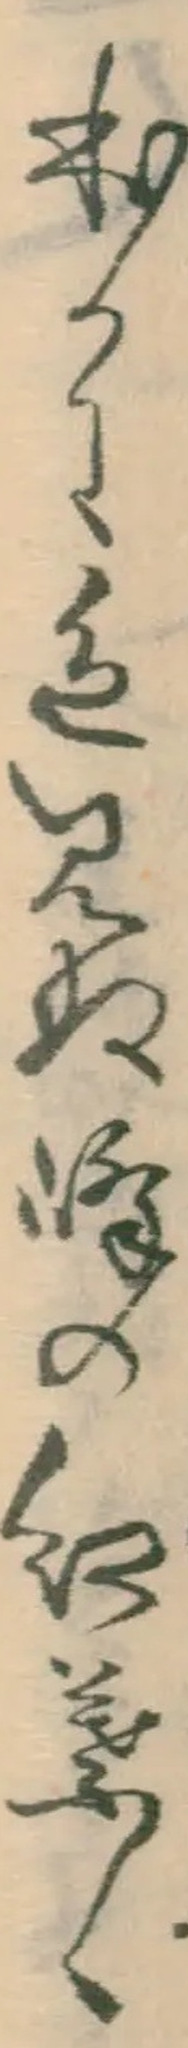ほかに色見ぬ峰の紅葉々
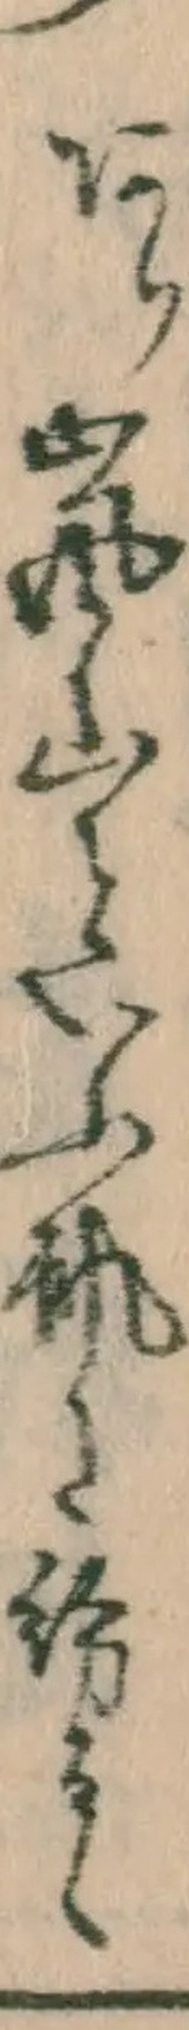あり嵐山といふ楓に紛るゝ
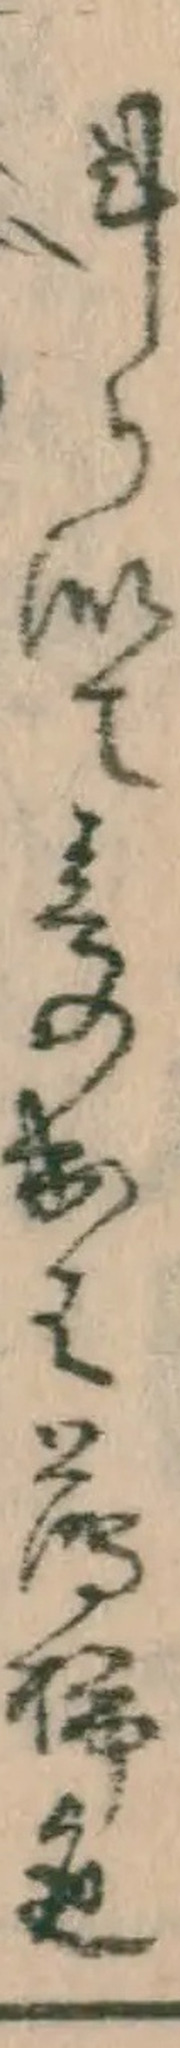計り似て春の出は薄柿色
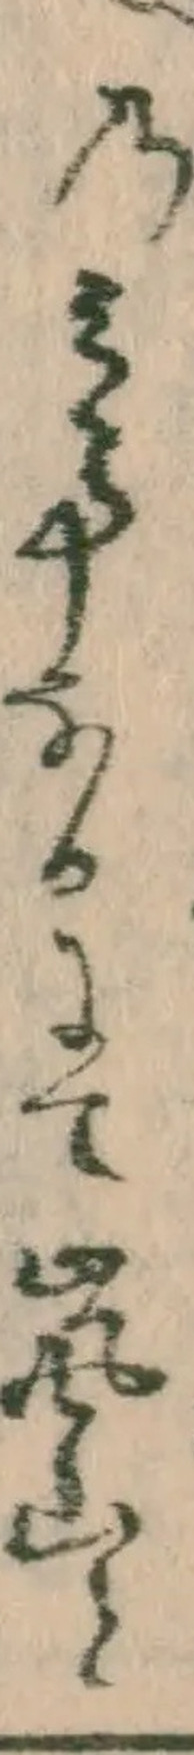のみ事なるにて嵐山と
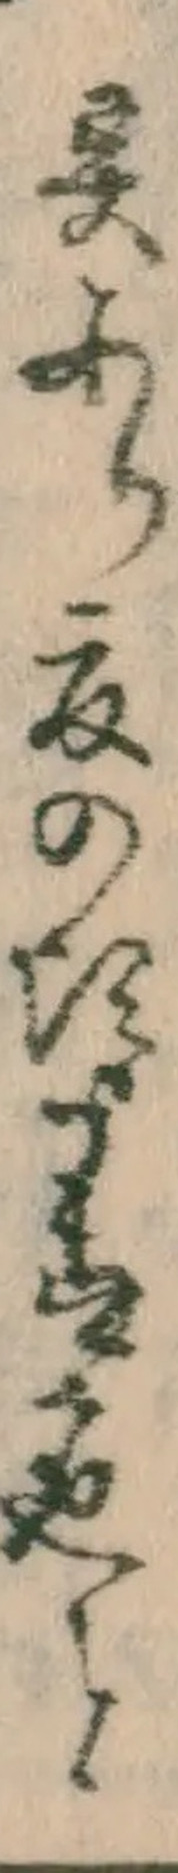異あり夏の頃うす色と
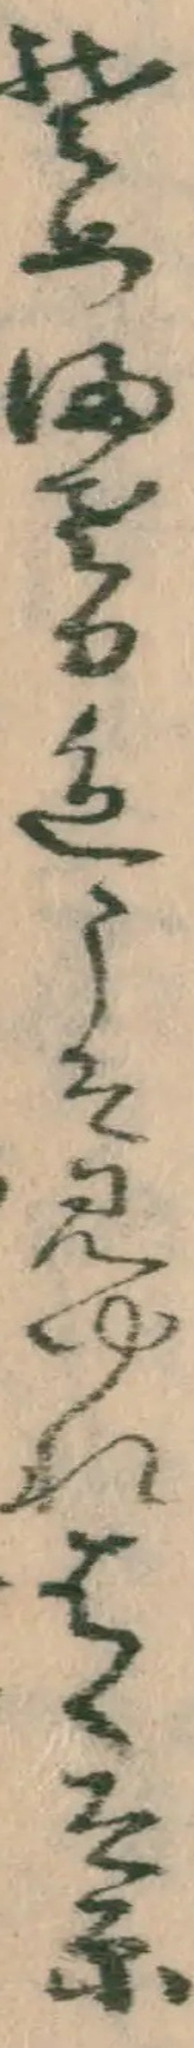そめまさる色こそ見ゆれはゝそ原
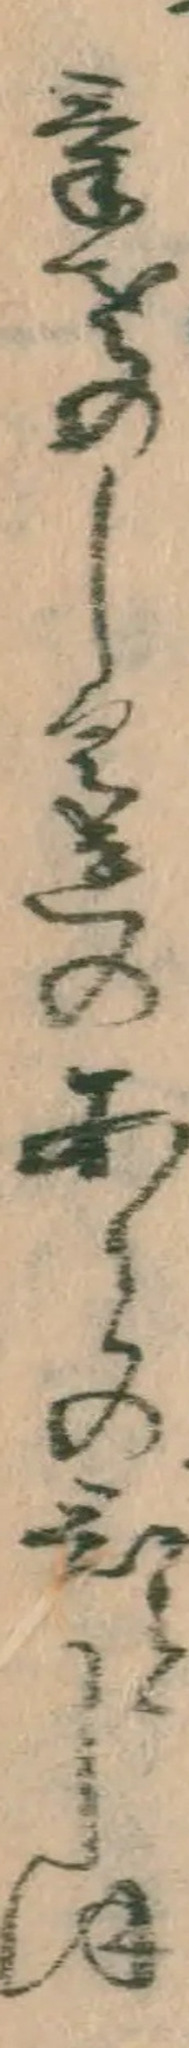けさのしくれのあとのひとしほ

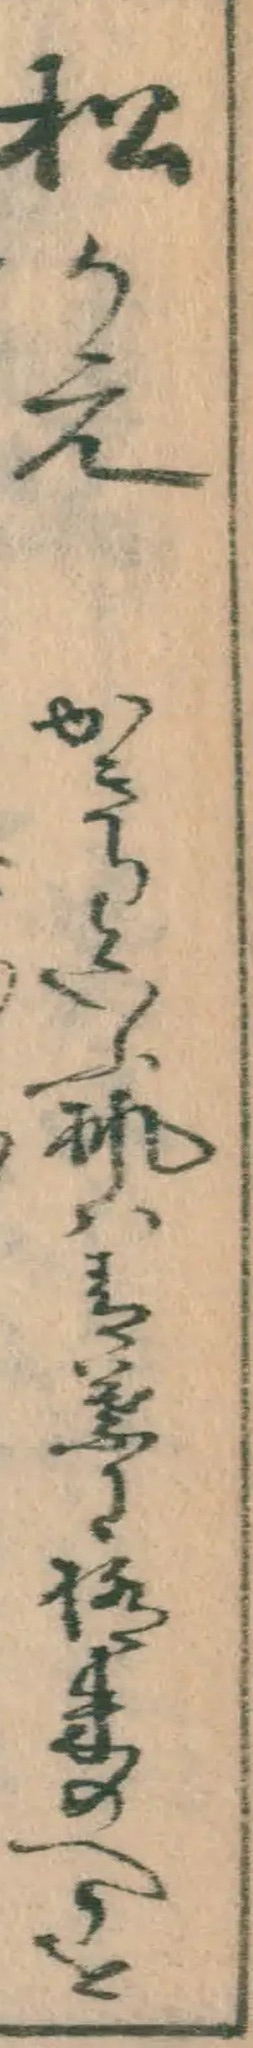松かえかきりといふ楓は青葉に極朱のへりを
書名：紅葉集
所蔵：国立国会図書館 National Diet Library, JAPAN
